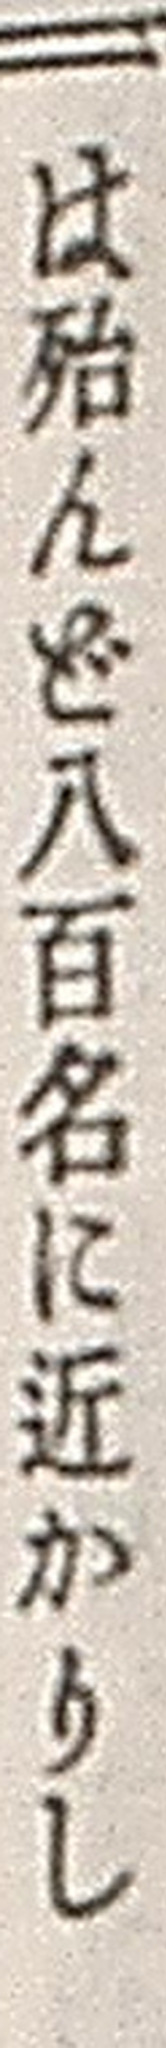は殆んど八百名に近かりし
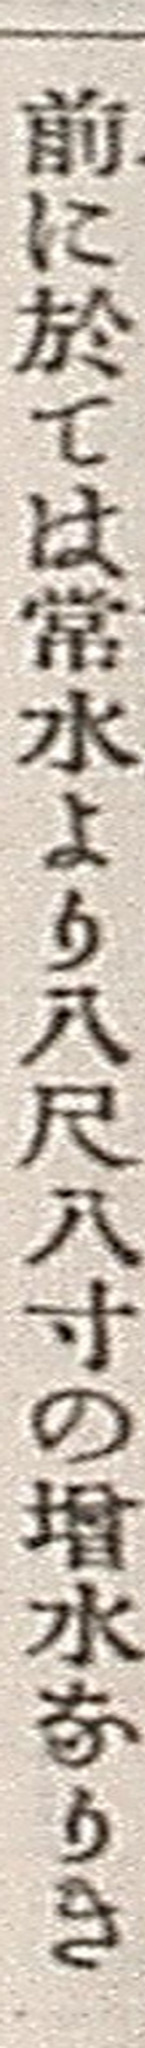前に於ては常水より八尺八寸の増水なりき
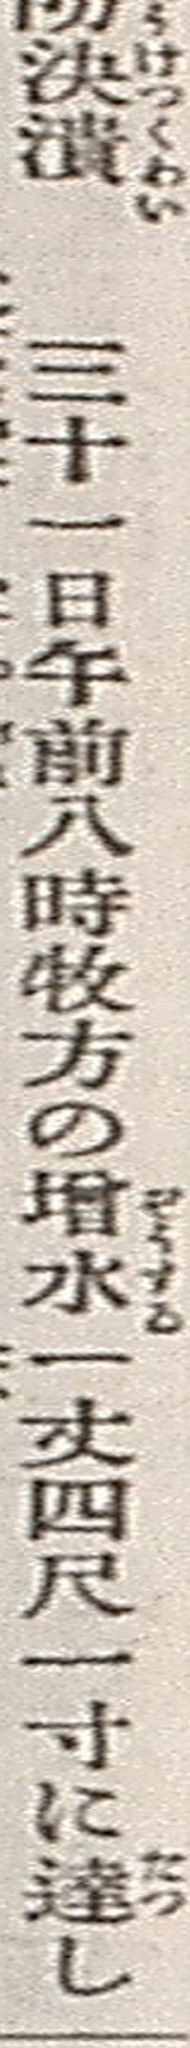堤防決潰三十一日午後八時牧方の増水一丈四尺一寸に達し
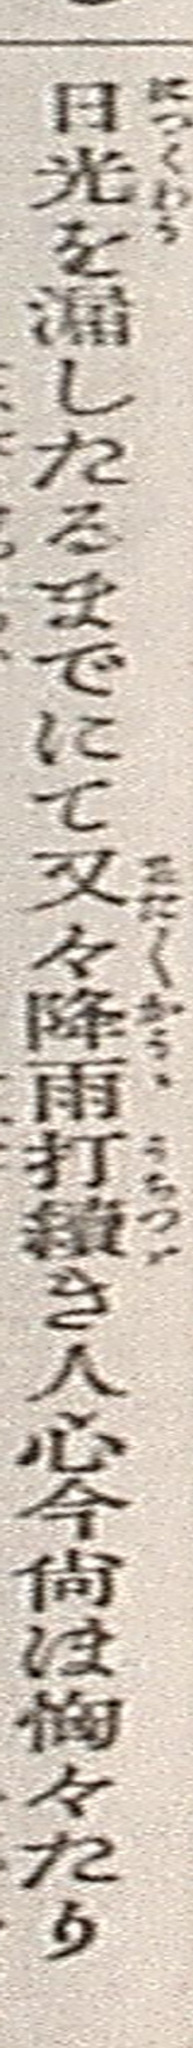日光を漏したるまでにて又々降雨打続き人心今尚ほ恟々たり
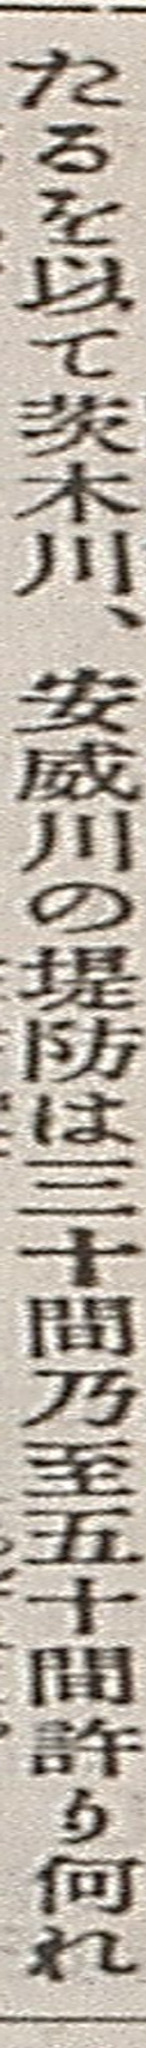たるを以て茨木川、安威川の堤防は三十間乃至五十間許り何れ
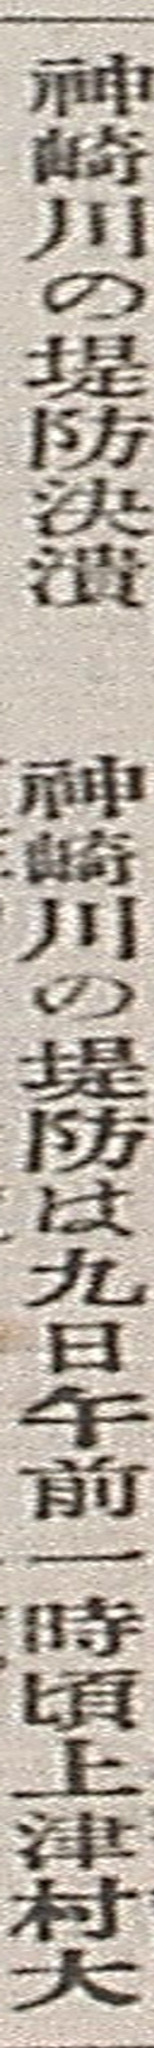神崎川の堤防決潰神崎川の堤防は九日午前一時頃上津村大
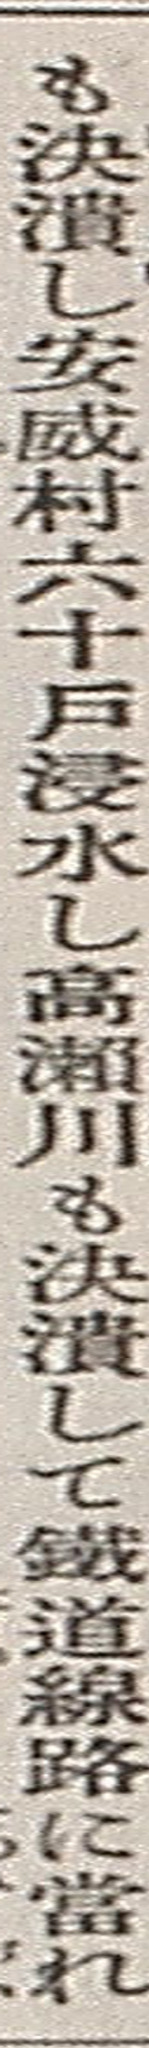も決潰し安威村六十戸浸水し高瀬川の決潰して鉄道線路に当れ
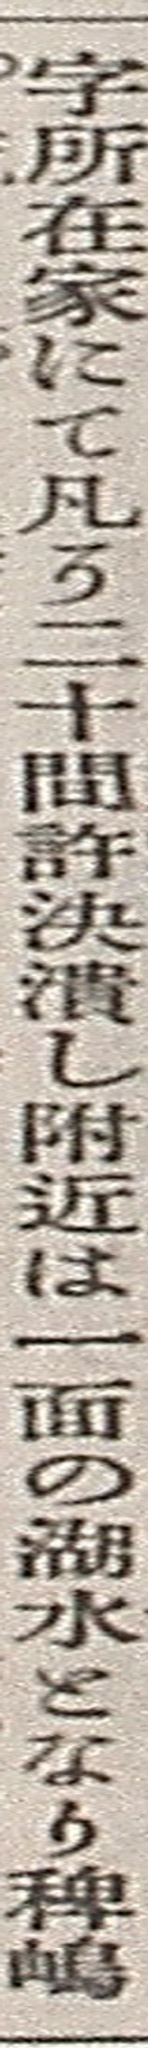字所在家にて凡そ二十間許決潰し附近は一面の湖水となり稗嶋
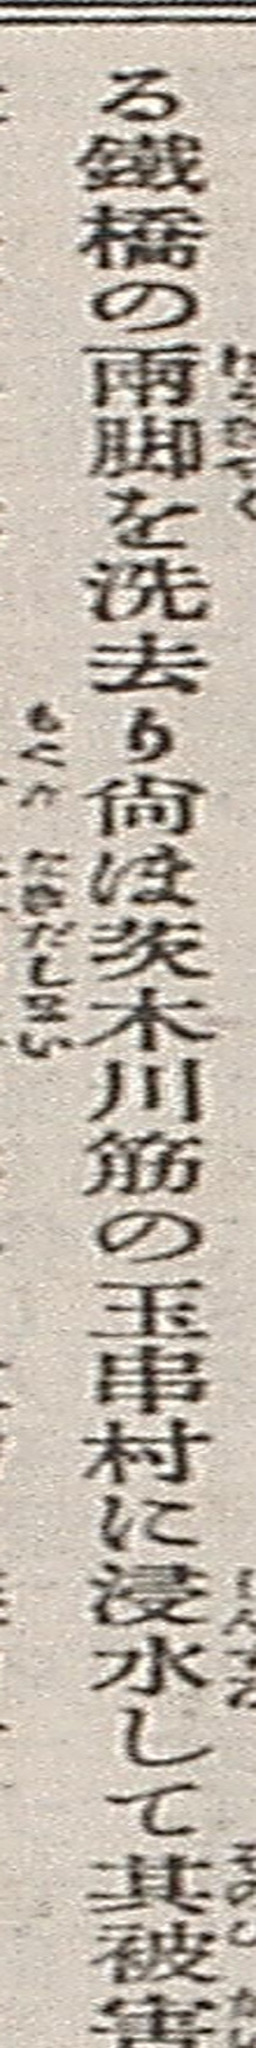る鉄橋の両脚を洗去り尚ほ茨木川筋の玉串村に浸水して其被害
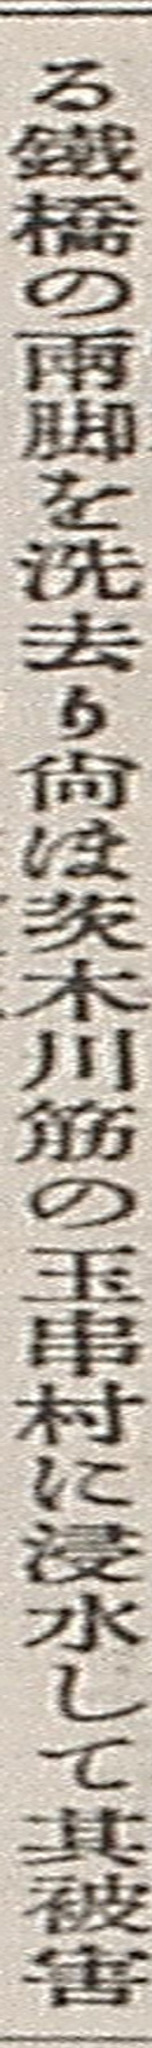る鉄橋の両脚を洗去り尚ほ茨木川筋の玉串村に浸水して其被害
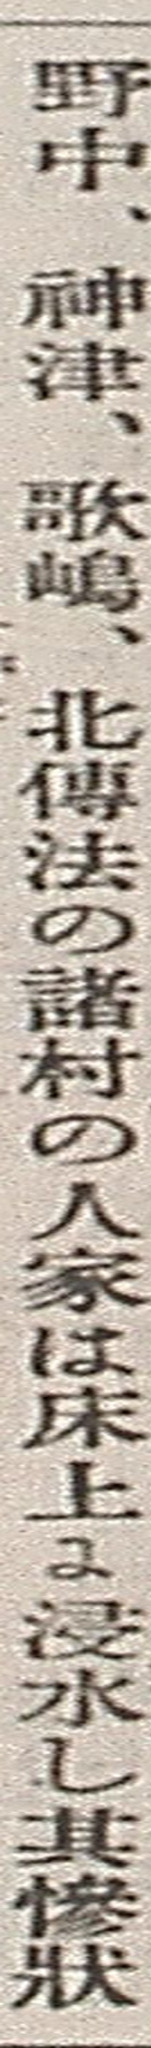野中、神津、歌嶋、北伝法の諸村の人家は床上に浸水し其惨状
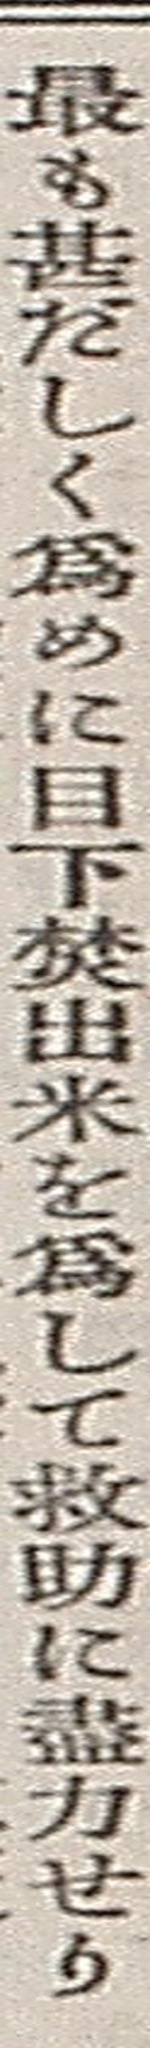最も甚だしく為めに目下焚出米を為して救助に尽力せり
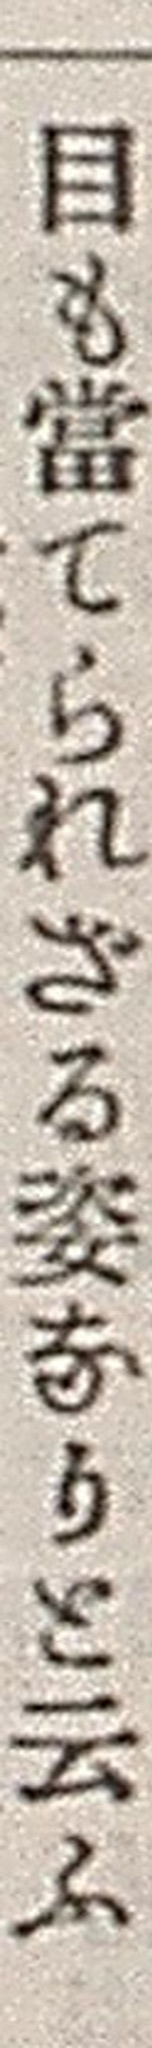目も当てられざる姿なりと云ふ
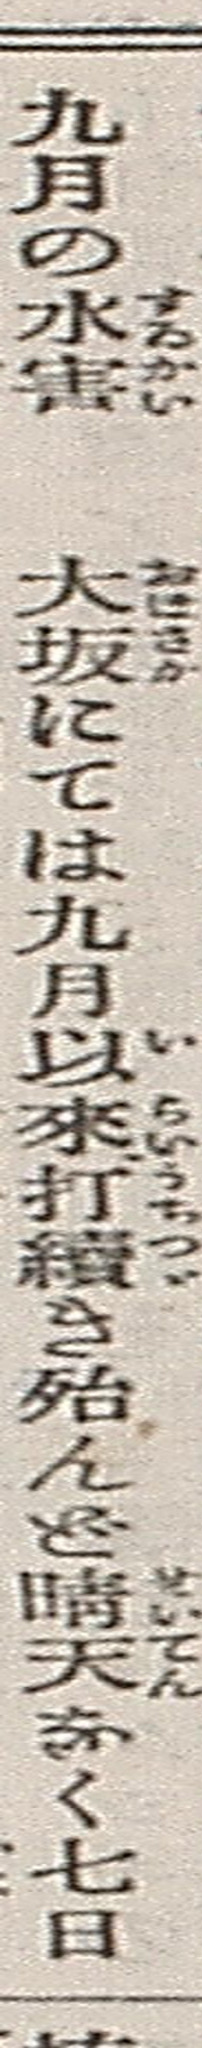九月の水害大坂にては九月以来打続き殆んど青天なく七日
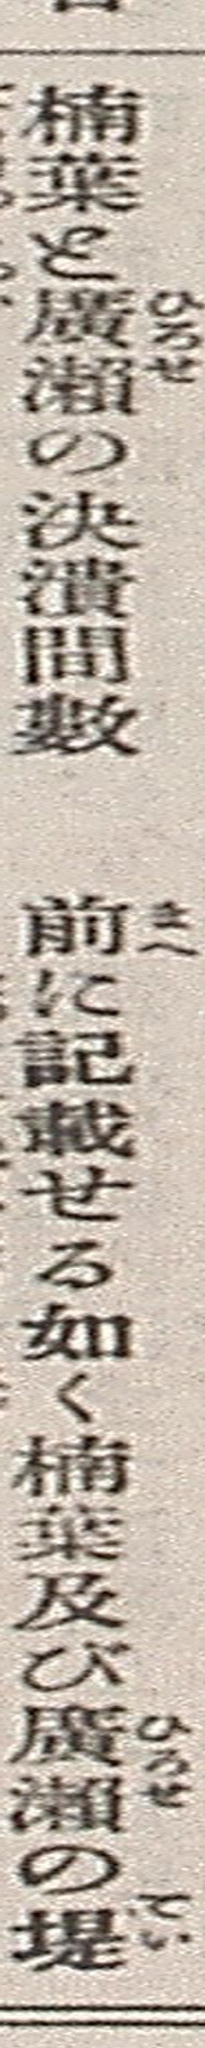楠葉と広瀬の決潰間数前に記載せる如く楠葉及び広瀬の堤
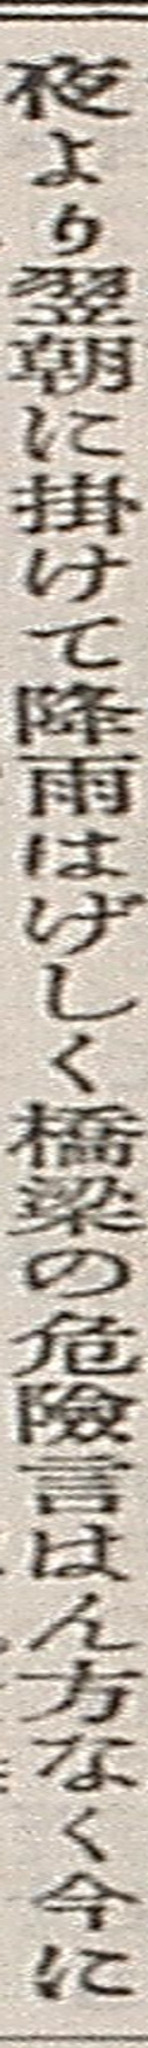夜より翌朝に掛けて降雨はげしく橋梁の危険言はん方なく今に
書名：風俗畫報臨時増刊第百二十八號　洪水被害録（下）
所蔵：東京大学地震研究所図書室 Earthquake Research Institute Library, The University of Tokyo, JAPAN
